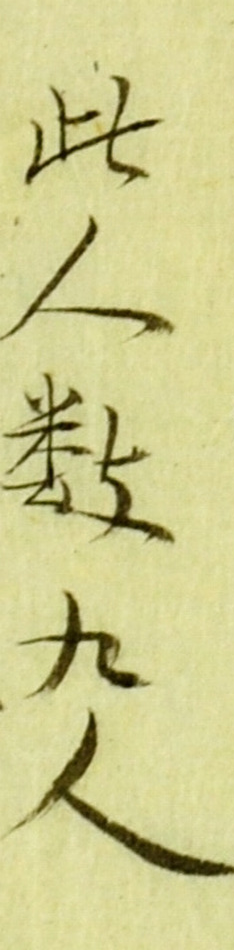此人数九人
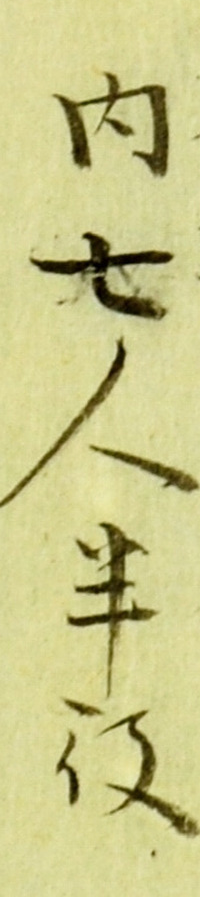内七人半役
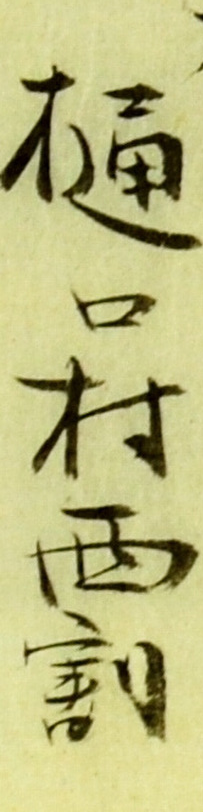樋口村西割
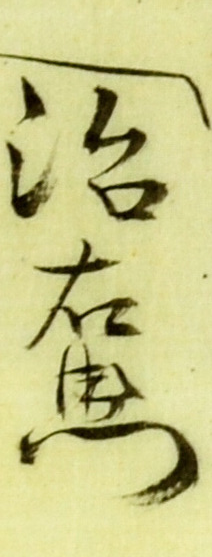治右衛門
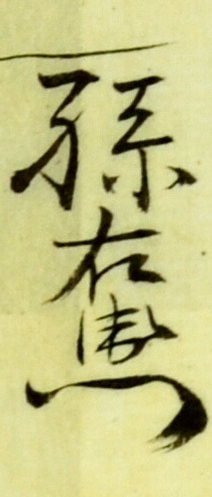治右衛門

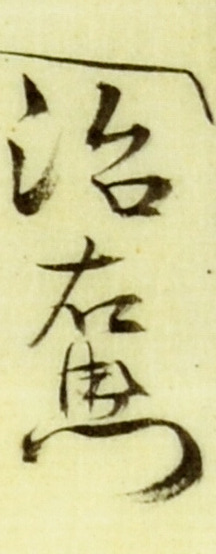又右衛門
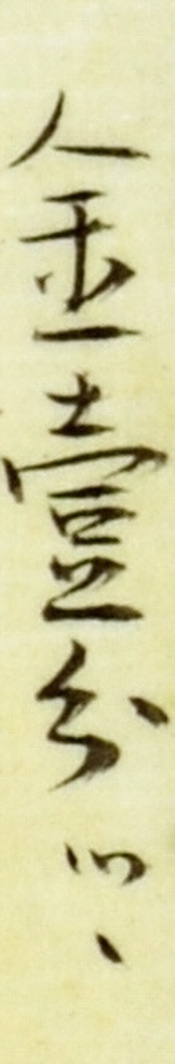金壱分市重
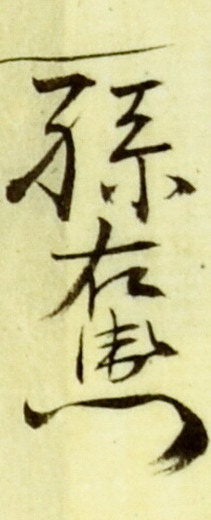又右衛門
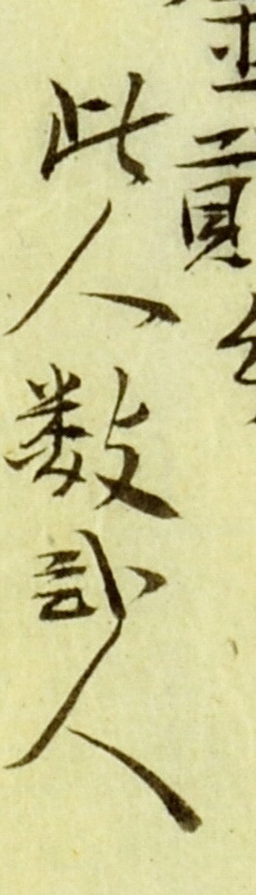此人数弐人
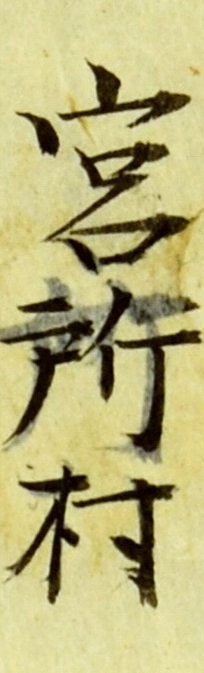宮所村
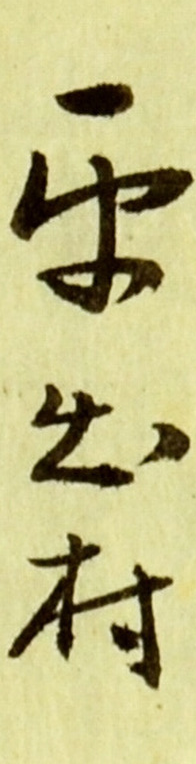平出村
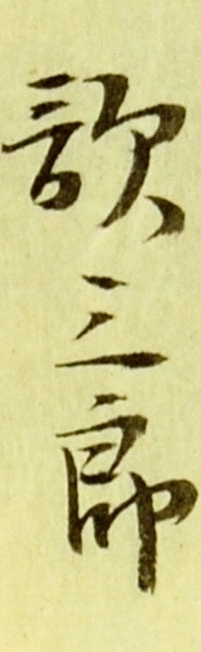歌三郎
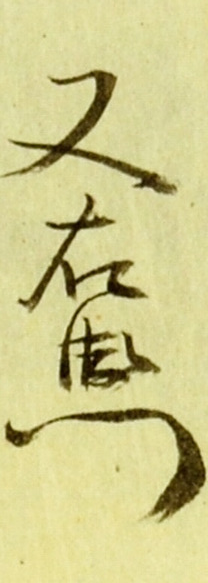又右衛門
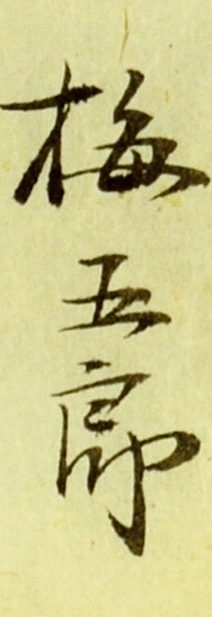梅五郎
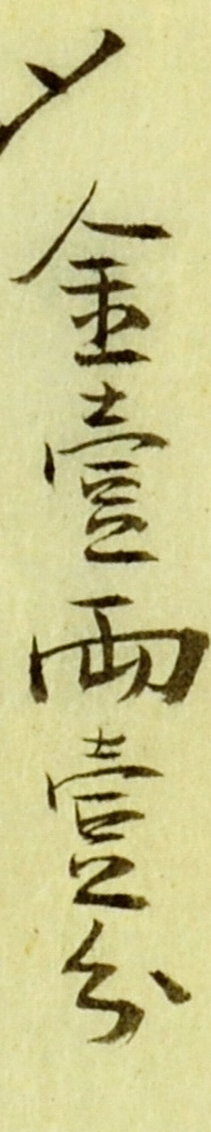〆金壱両壱分
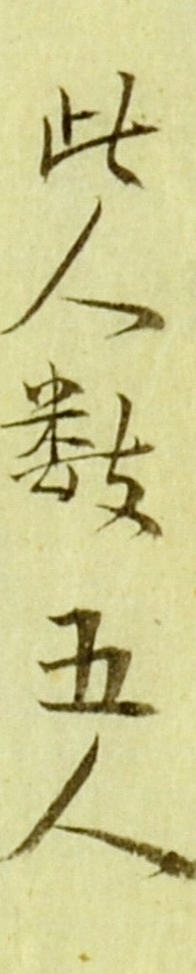此人数五人
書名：上伊那郷諸運上取調帳
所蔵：伊那市立高遠町図書館・合同会社AMANE
